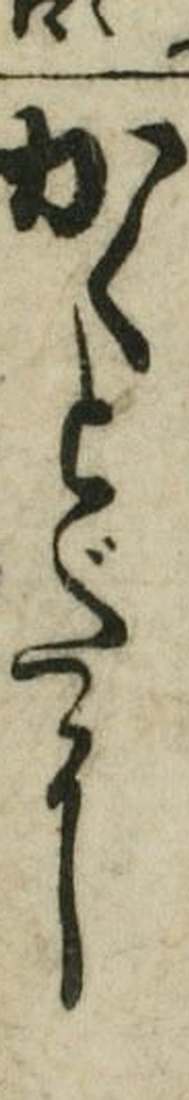かくとだに
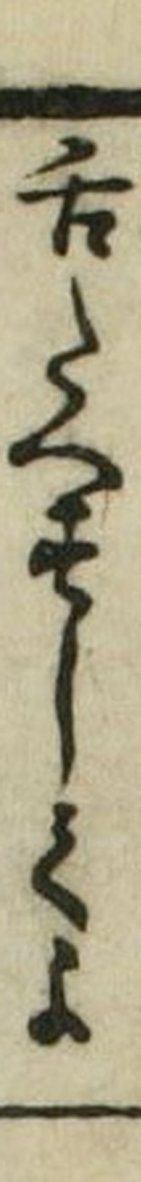舌たへすしてよ
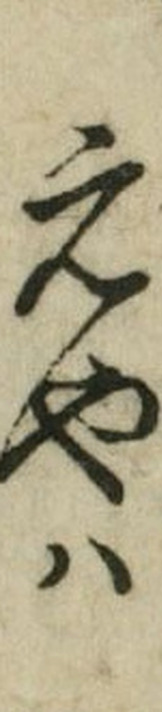えやは
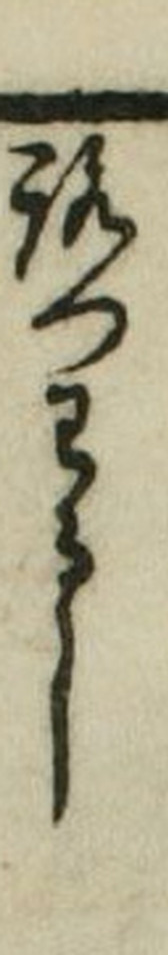ろつわるし
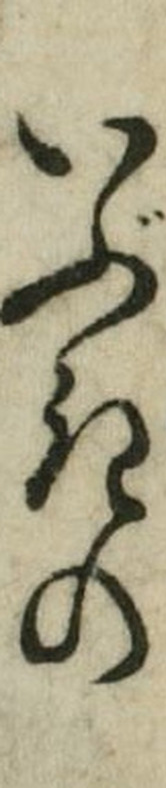いぶきの
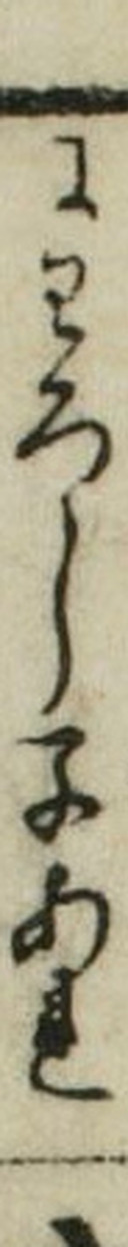にわろし子あれ
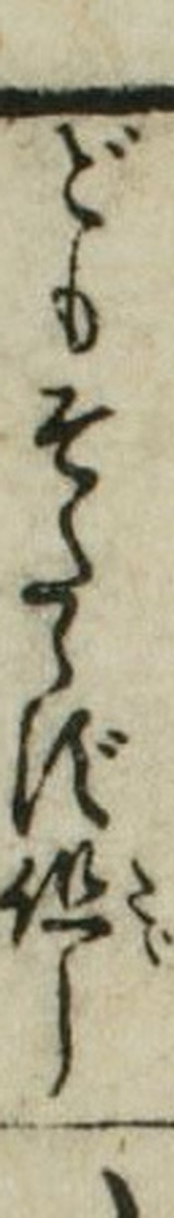どもそたゝず但し
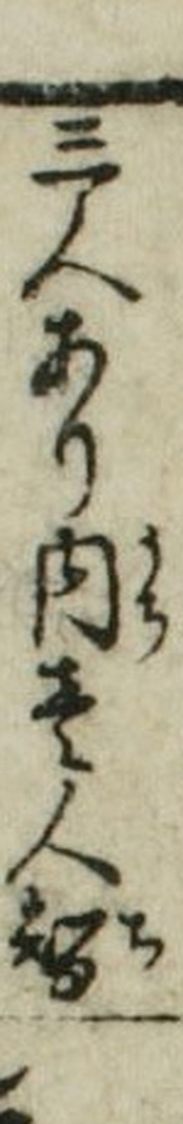三人あり内壱人智
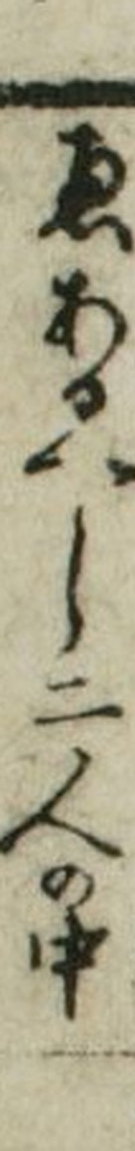ゑあるへし二人の中
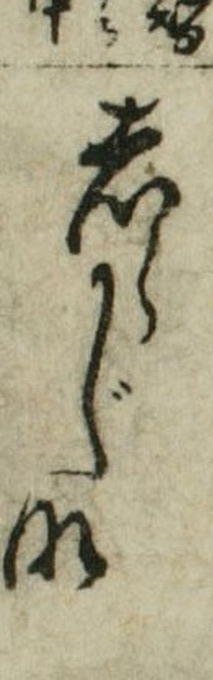しらじな
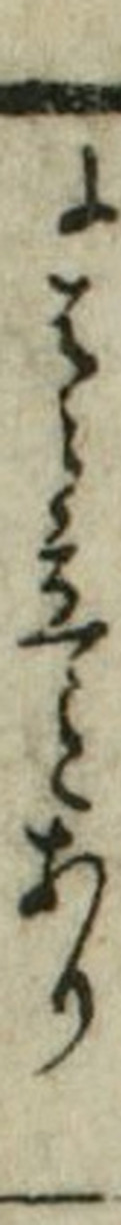にはら立もあり
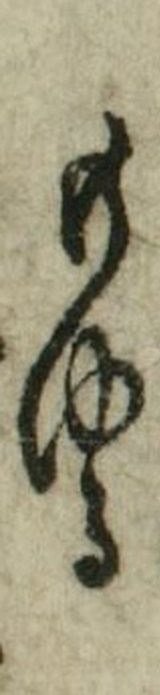もゆる
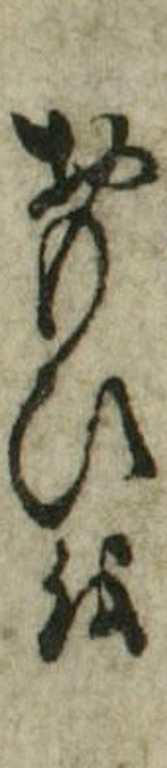おもひを

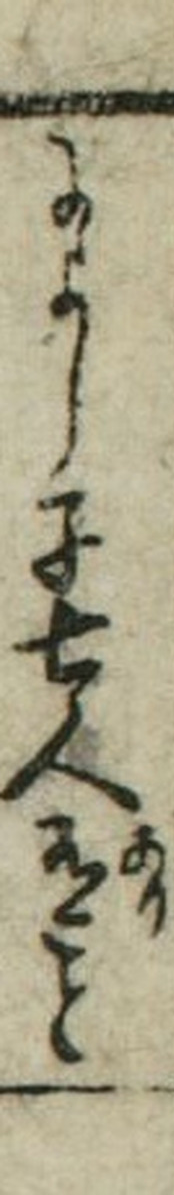によし子七人有こと
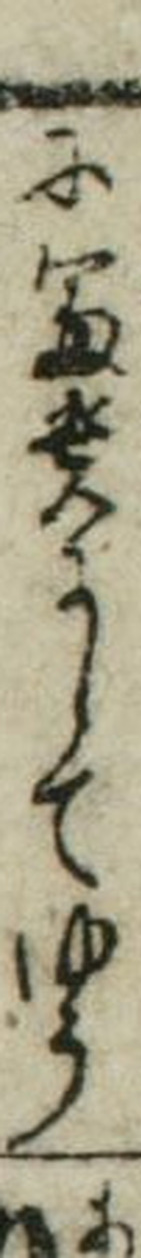に富貴にしてゆう
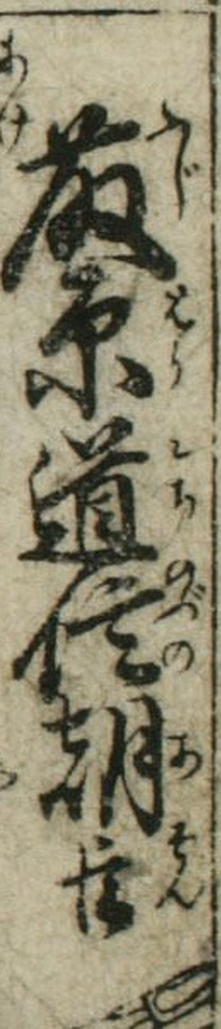藤原道信朝臣
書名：百人一首
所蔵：東京学芸大学教育コンテンツアーカイブ
